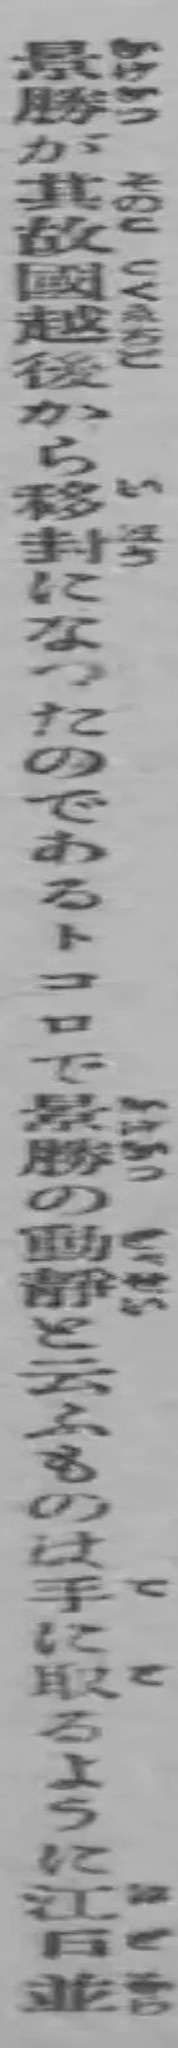景勝が其故国越後から移封になつたのであるトコロで景勝の動静と云ふものは手に取るように江戸並
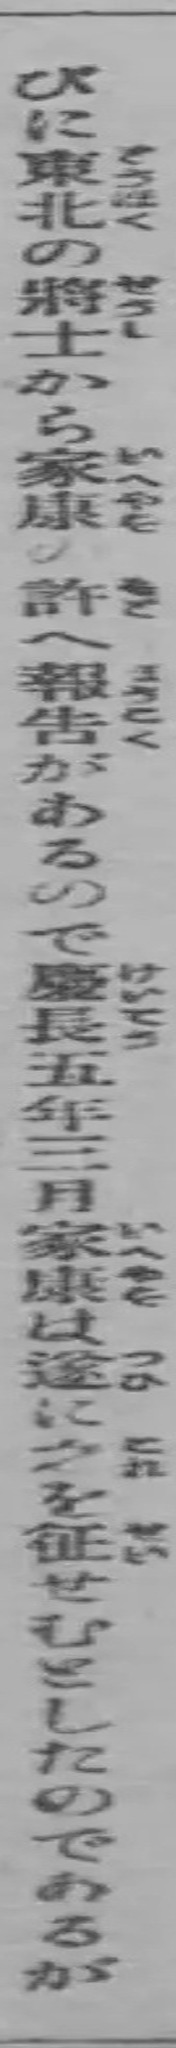びに東北の将士から家康の許へ報告があるので慶長五年三月家康は遂に之を征せむとしたのであるが
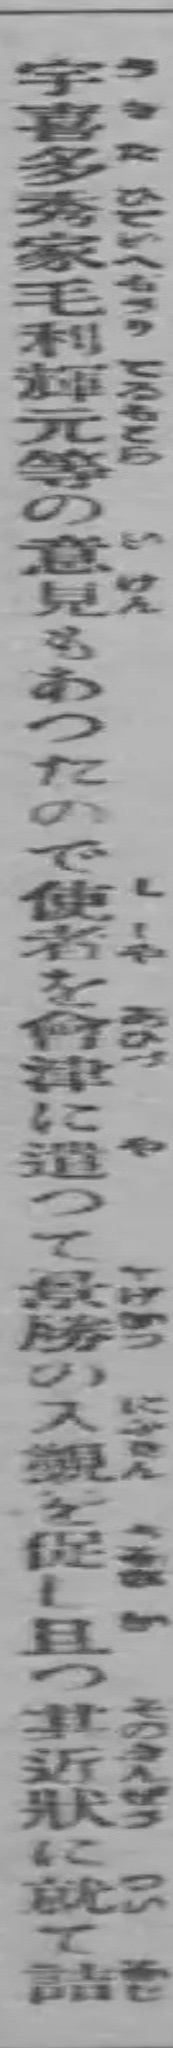宇喜多秀家毛利輝元等の意見もあつたので使者を会津に遣つて景勝の入覲を促し且つ其近状に就て詰

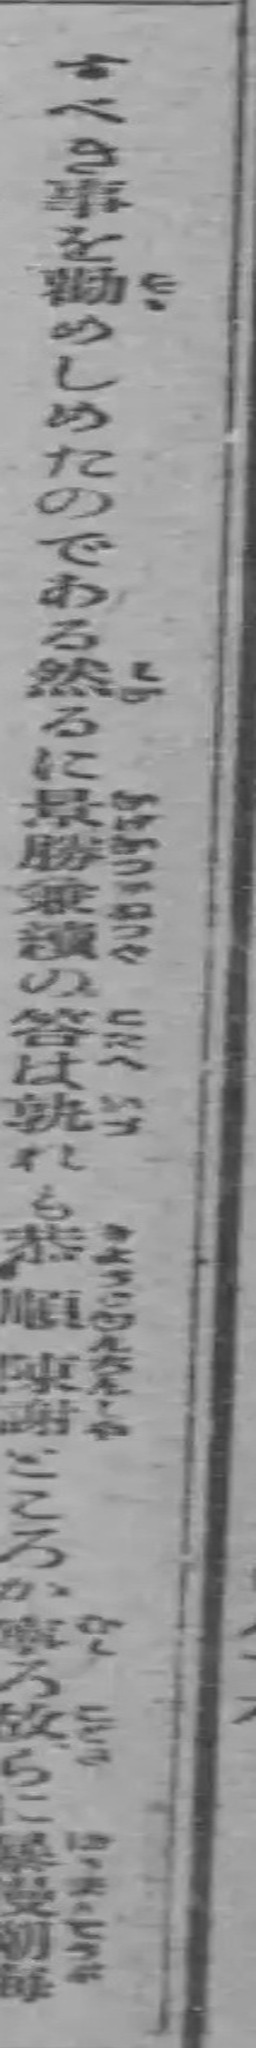すべき事を勧めしめたのである然るに景勝兼続の答は孰れも恭順陳謝ところか寧ろ故らに暴慢嘲侮
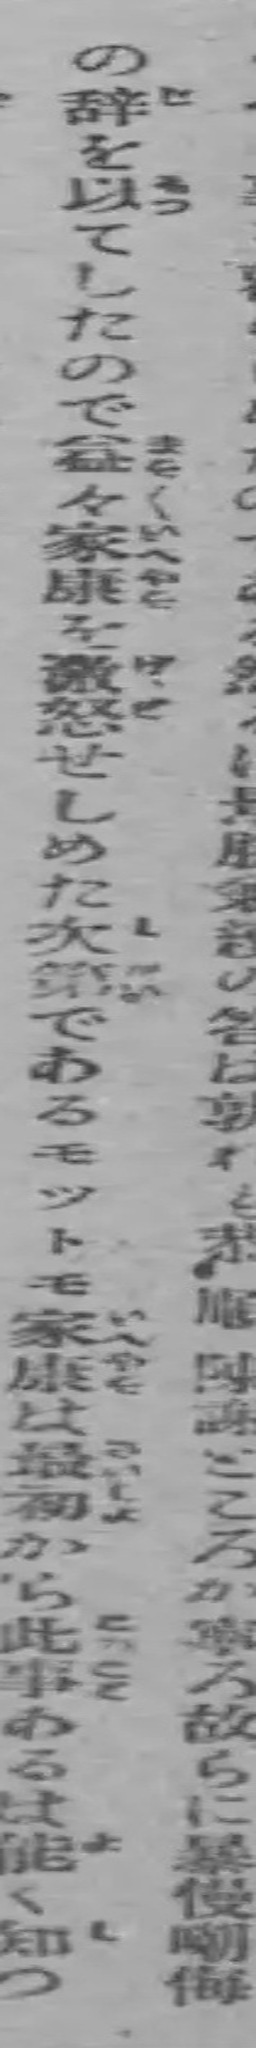の辞を以てしたので益々家康を激怒せしめた次第であるモツトモ家康は最初から此事あるは能く知つ
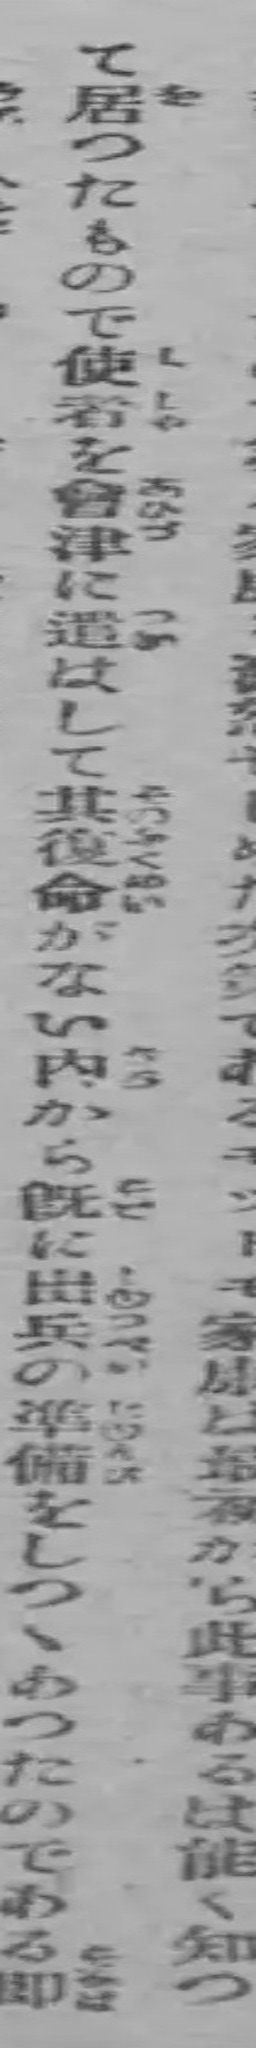て居つたもので使者を会津に遣はして其復命がない内から既に出兵の準備をしつゝあつたのである即
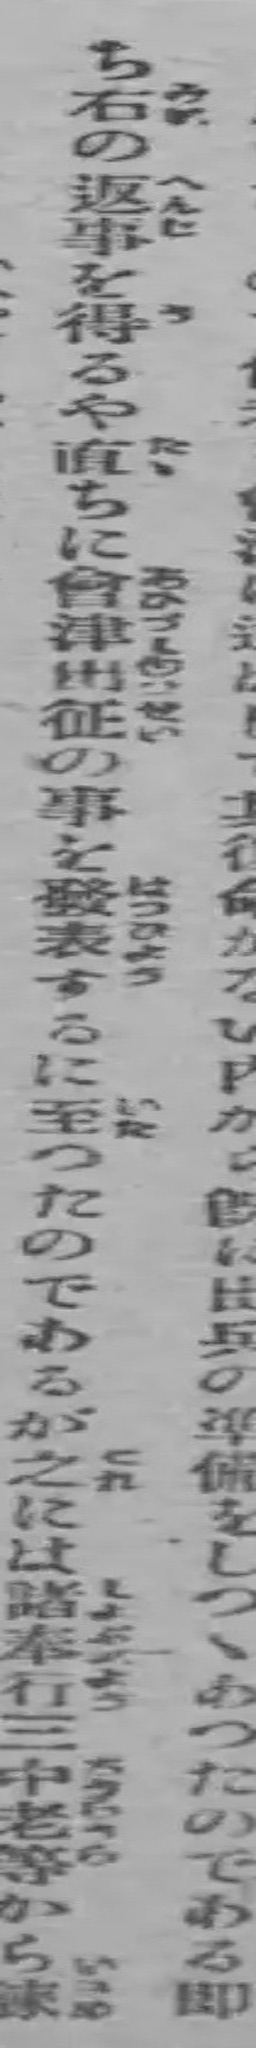ち右の返事を得るや直ちに会津出征の事を発表するに至つたのであるが之には諸奉行三中老等から諌
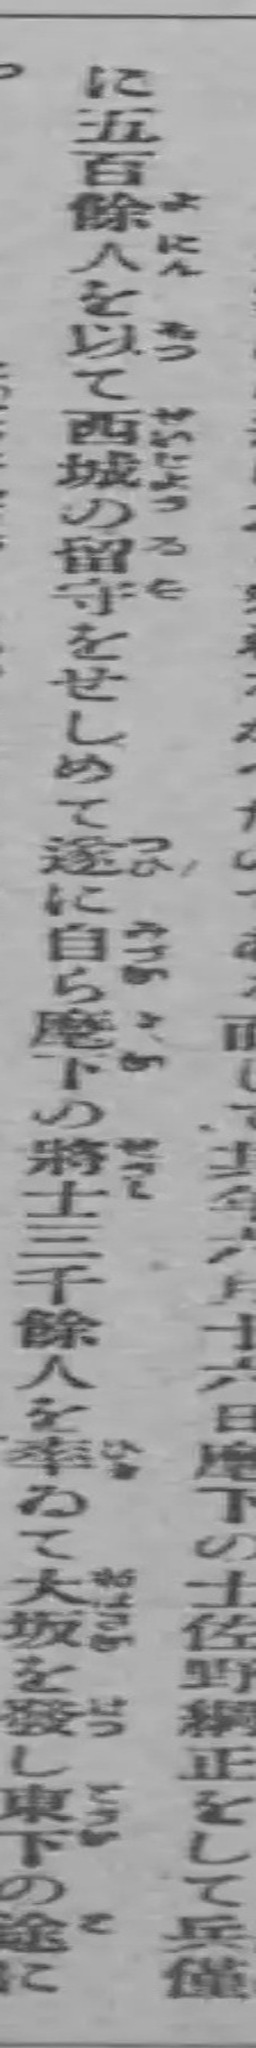に五百余人を以て西城の留守をせしめて遂にみず自ら麾下の将士三千余人を率ゐて大坂を発し東下の途に
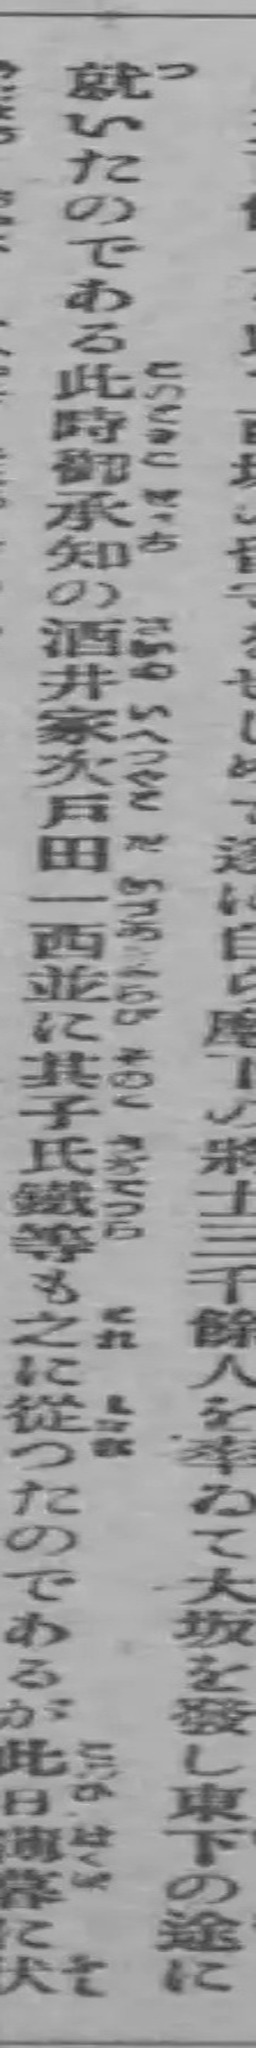就いたのである此時御承知の酒井家次戸田一西並に其子氏鉄等も之に従つたのであるが此日薄暮に伏
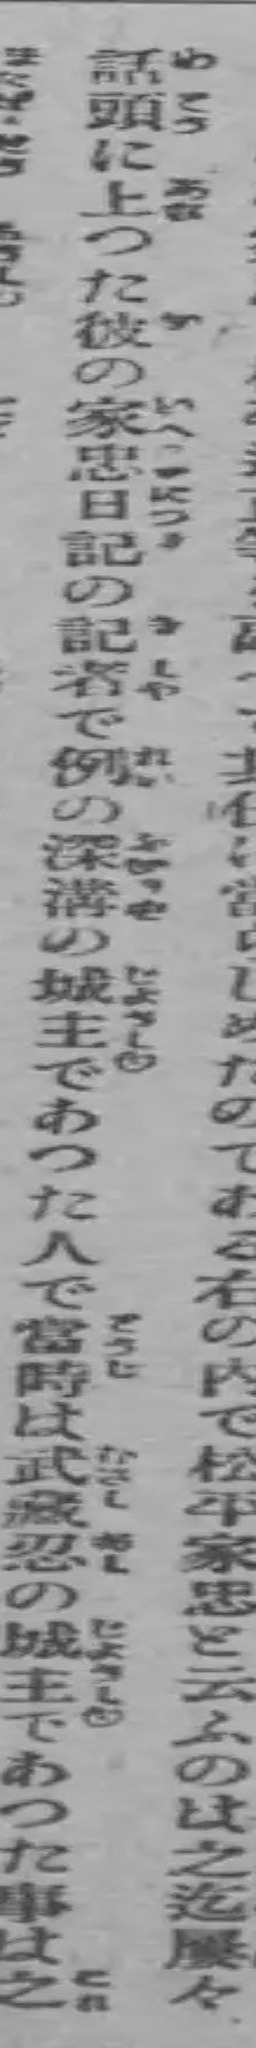話頭に上つた彼の家忠日記の記者で例の深溝の城主であつた人で当時は武蔵忍の城主であつた事は之
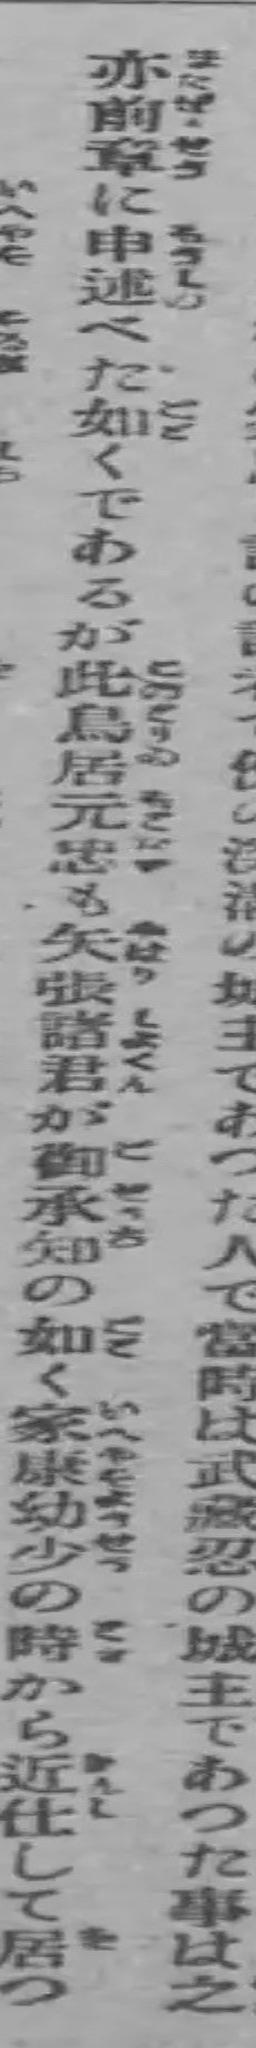亦前章に申述べた如くであるが此鳥居元忠も矢張諸君が御承知の如く家康幼少の時きから近仕して居つ
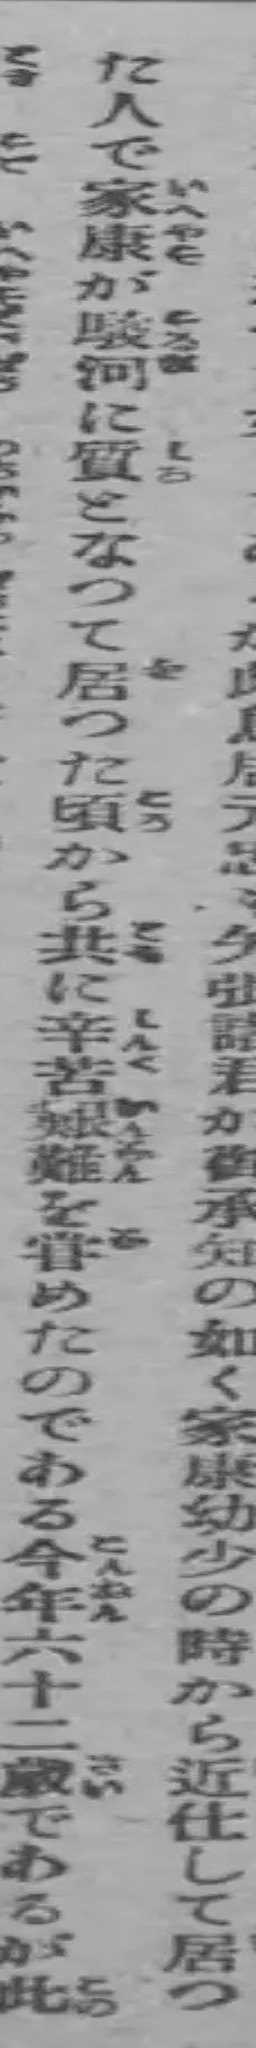た人で家康が駿河に質となつて居つた頃から共に辛苦艱難を甞めたのである今年六十二歳であるが此
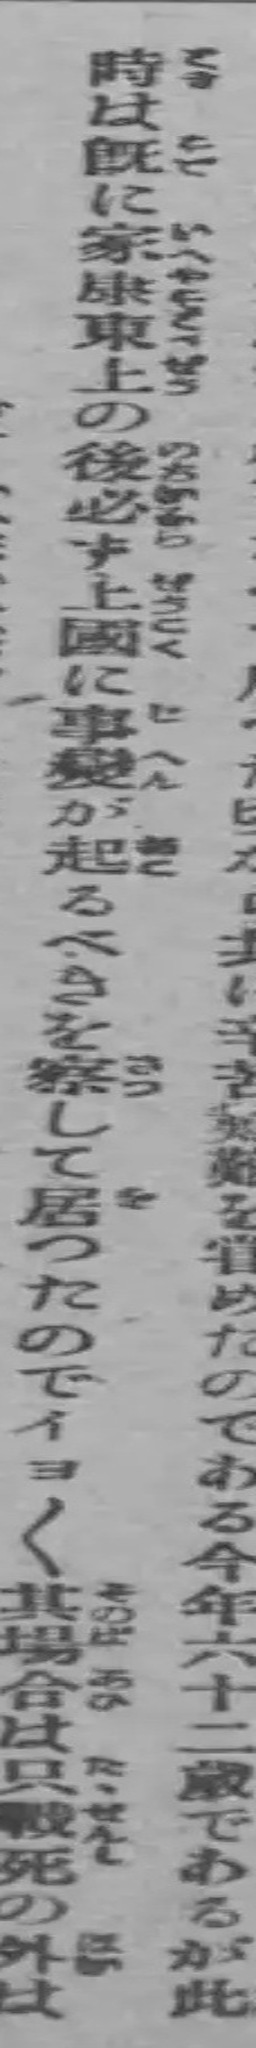時は既に家康東上の後必ず上国に事変が起るべきを察して居つたのでイヨ〳〵其場合は只戦死の外は
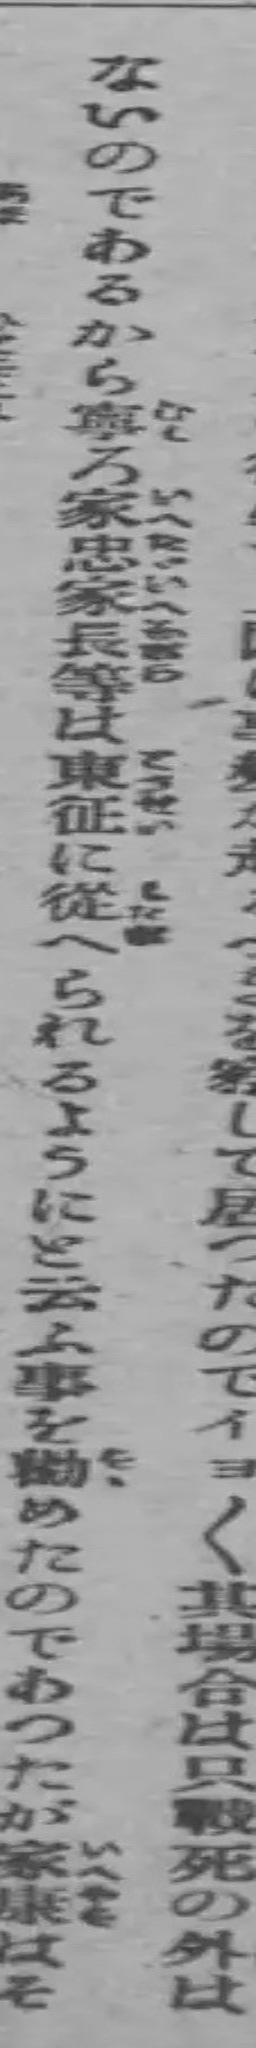ないのであるから寧ろ家忠家長等は東征に従へられるようにと云ふ事を勧めたのであつたが家康はそ
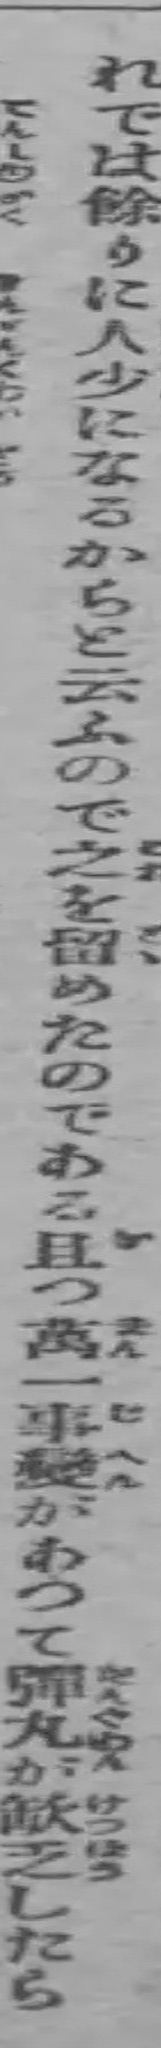れでは余りに人少になるからと云ふので之を留めたのである且つ万一事変があつて弾丸が欠乏したら
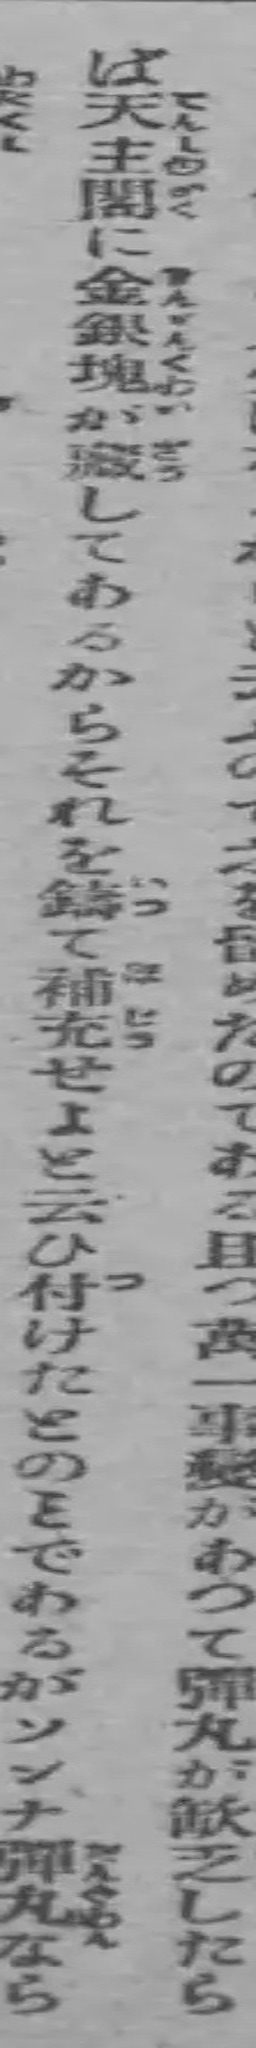ば天主閣に金銀塊が蔵してあるからそれを鋳て補充せよと云ひ付けたとのことであるがソンナ弾丸なら
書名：豊橋市史談
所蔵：国立国会図書館 National Diet Library, JAPAN
